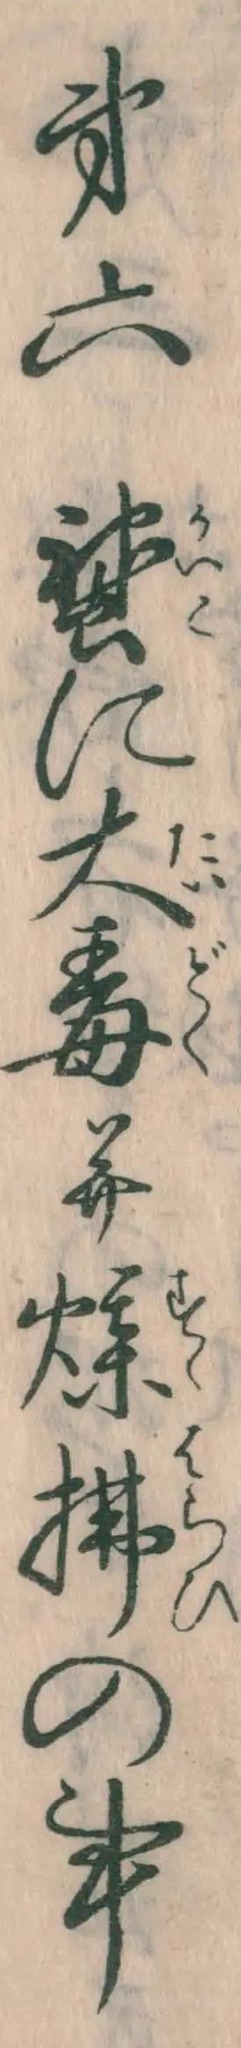第六䗝に大毒并煤払の事
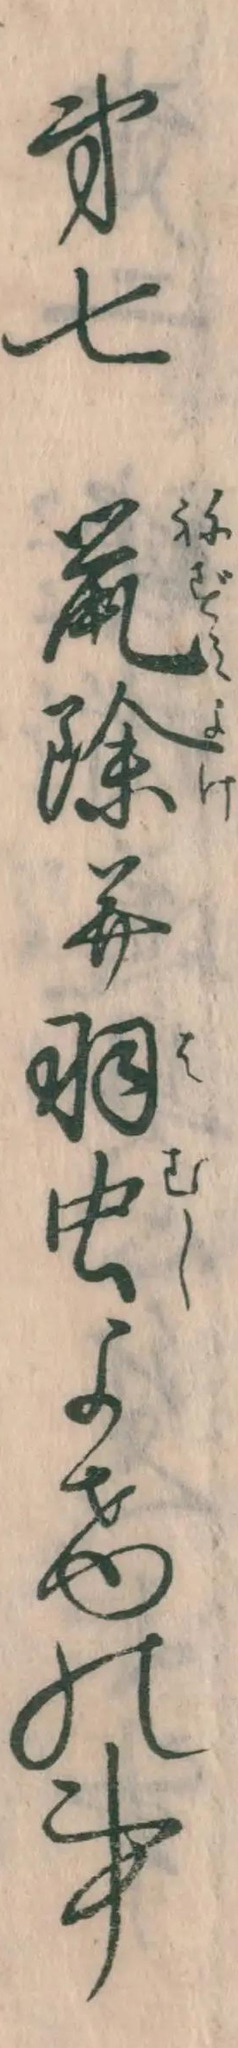第七鼠除并羽虫よけの事
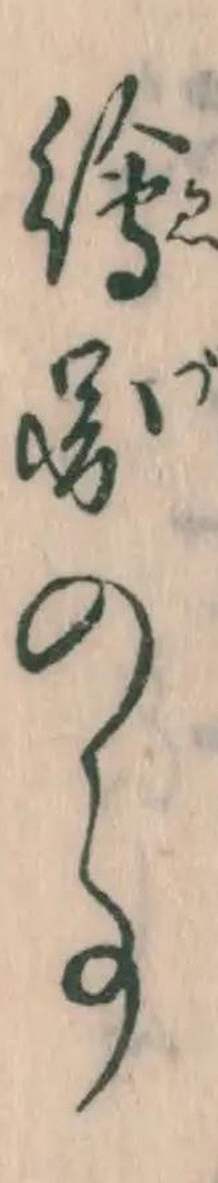絵図の事
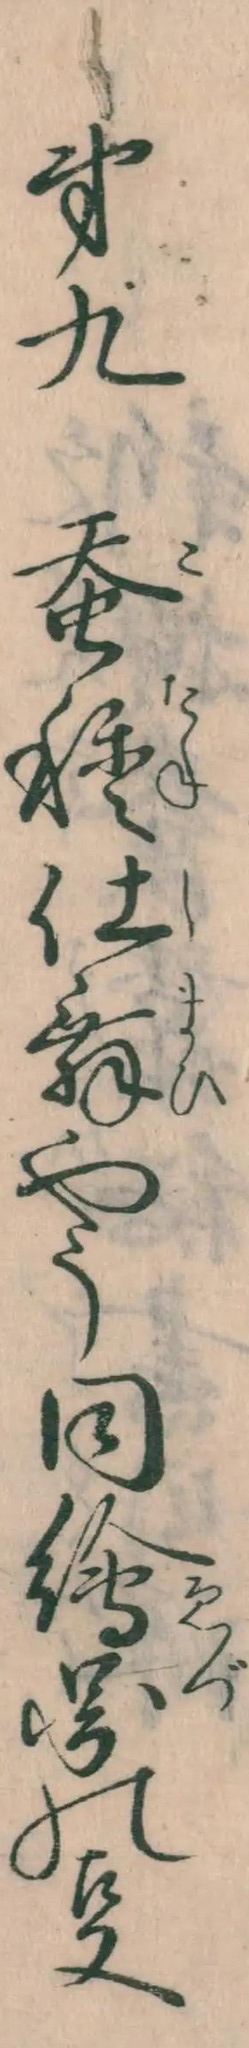第九蚕種仕舞やう同絵図の事
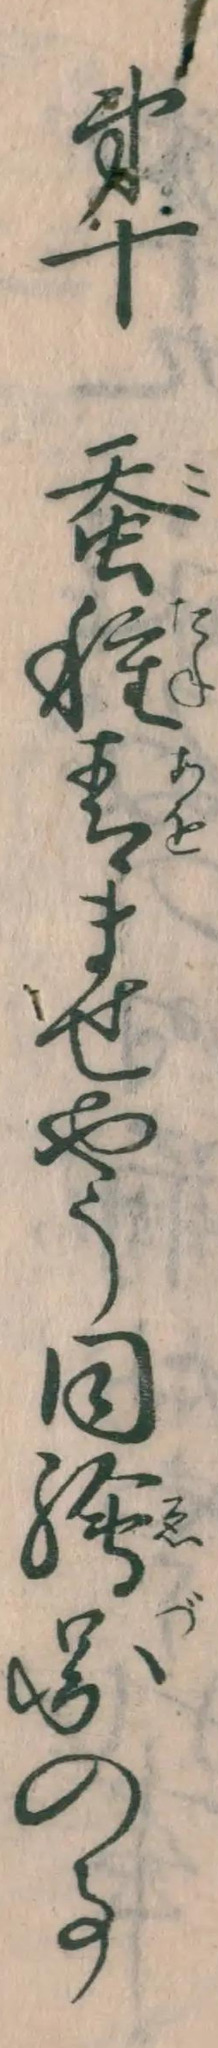第十蚕種青ませやう同絵図の事
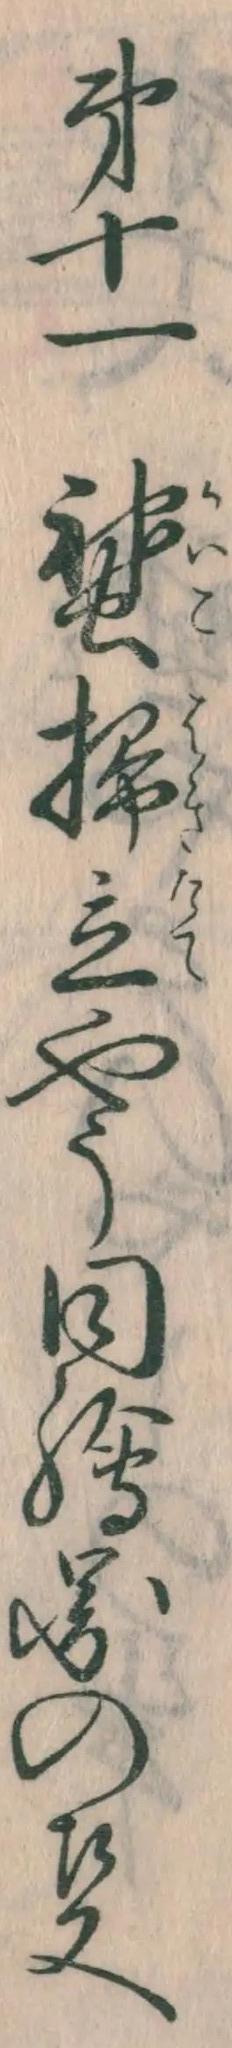第十一䗝掃立やう同絵図の事
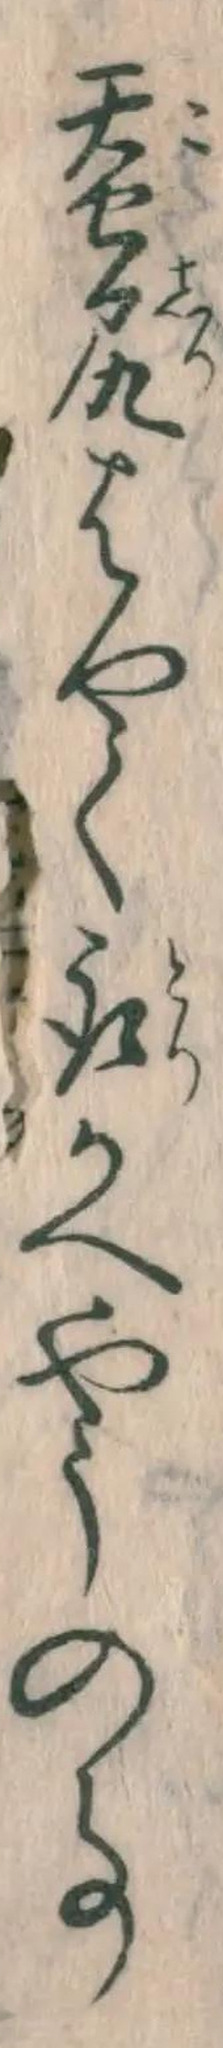蚕尻はやく取かへやうの事
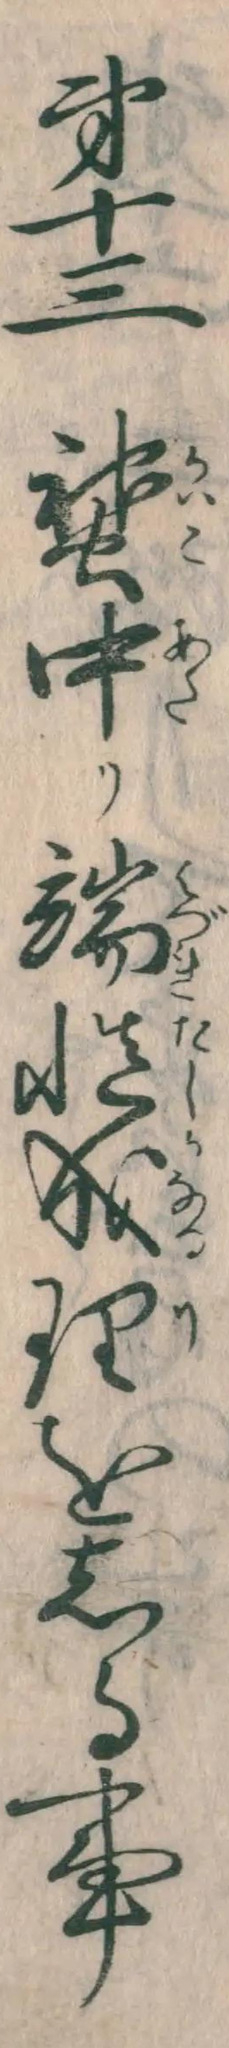第十三䗝中り端慥成理をしる事
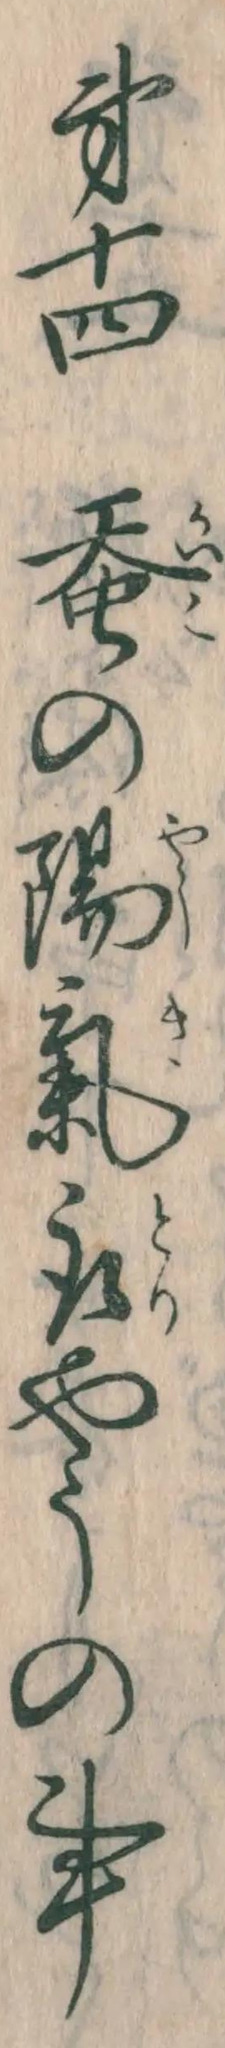第十四蚕の陽気取やうの事

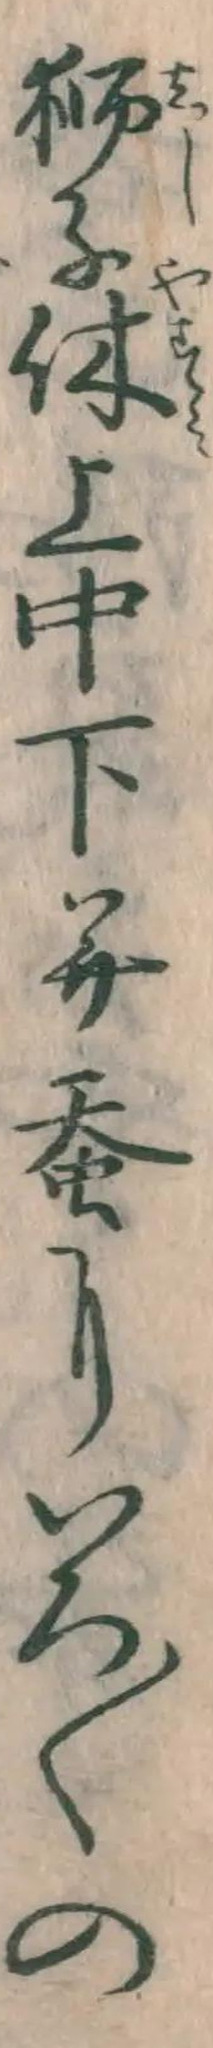第十五獅子休上中下蚕にいろ〳〵の
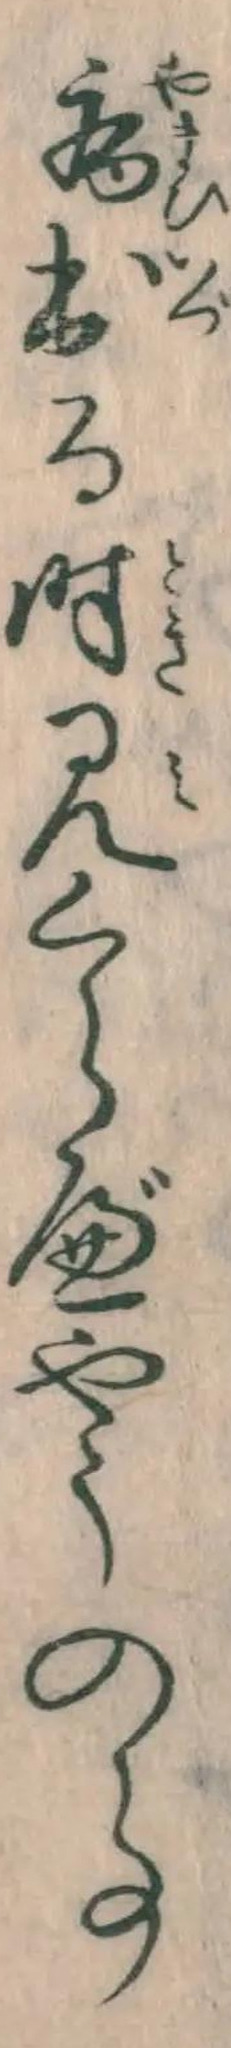病出る時見くらべやうの事
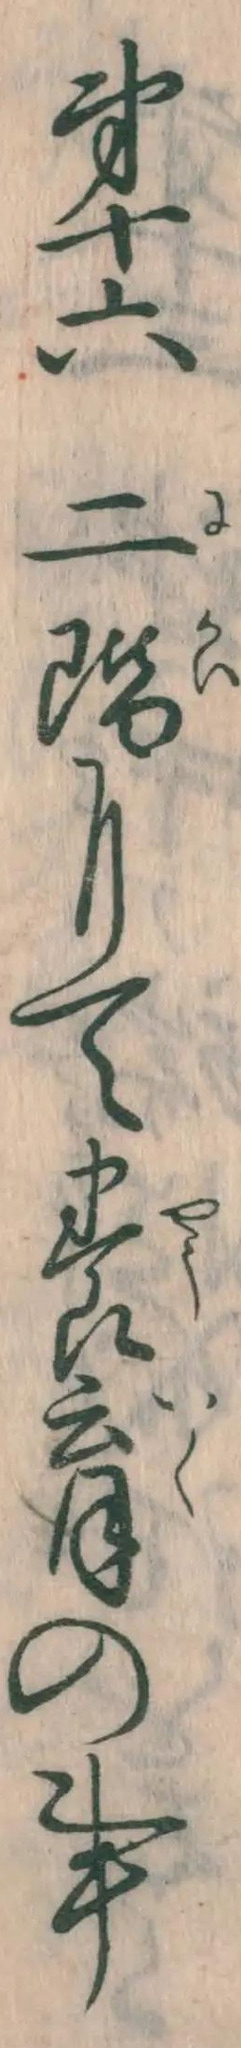第十六二階にて養育の事
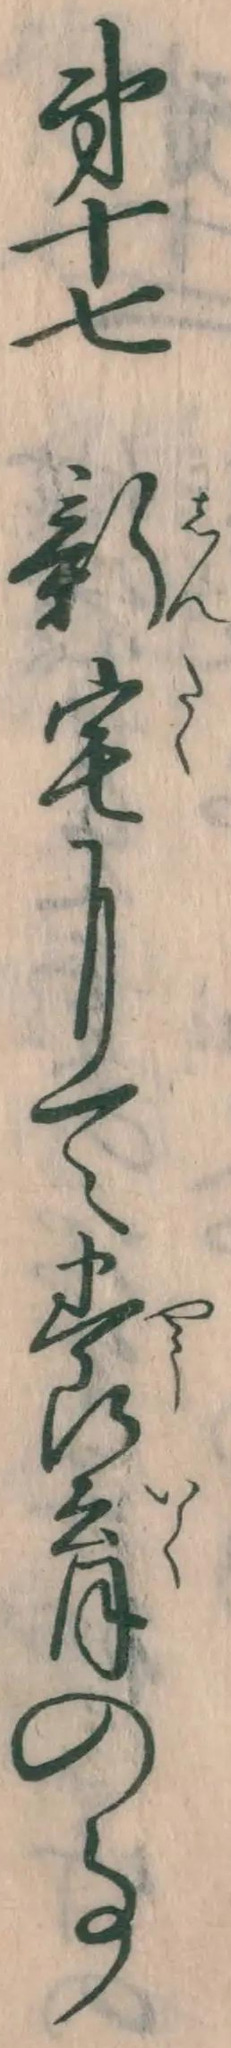第十七新宅にて養育の事
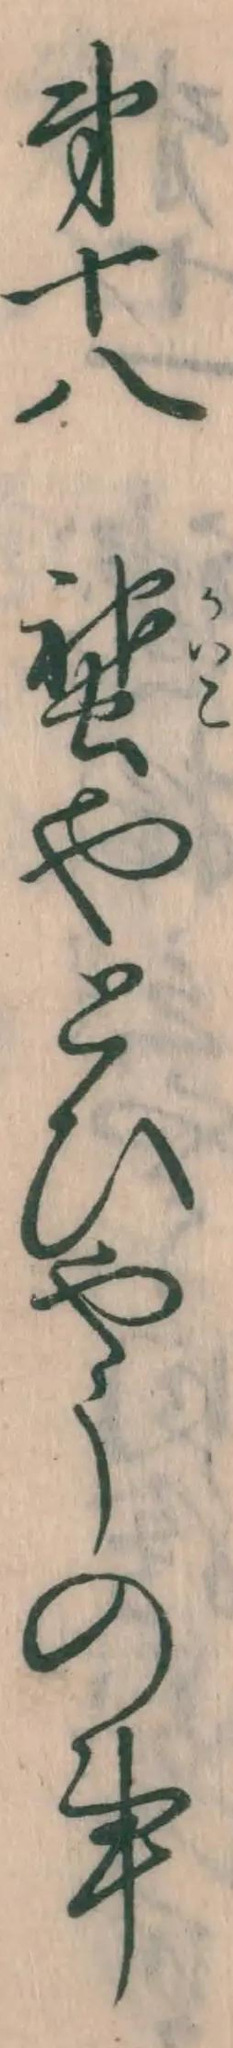第十八䗝やとひやうの事
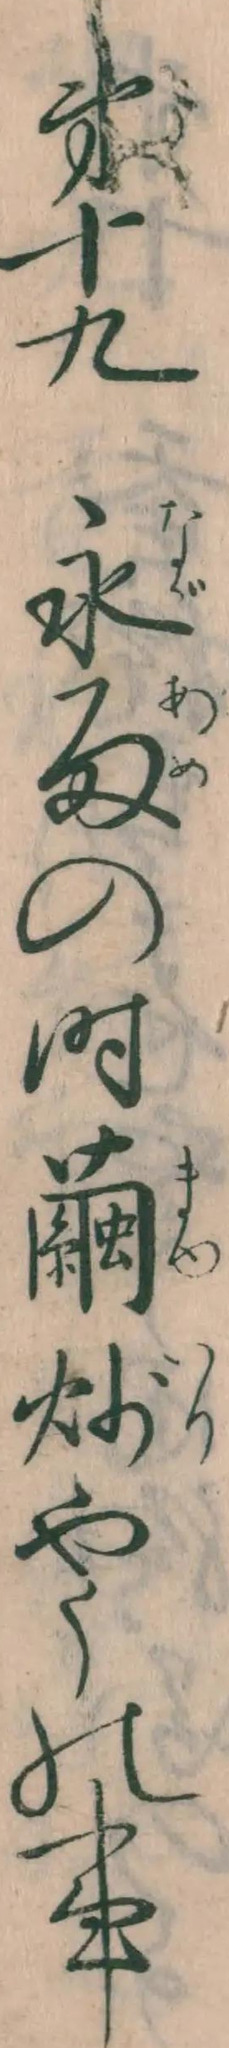第十九永雨の時繭炒やうの事

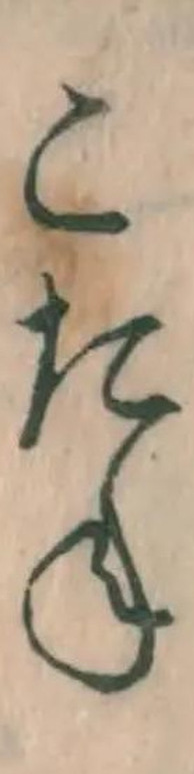こたね
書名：新撰養蚕秘書
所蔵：国立国会図書館 National Diet Library, JAPAN
